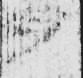月
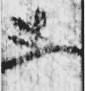之
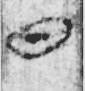日
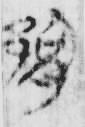○（宛）
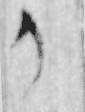人
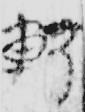○（範）
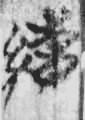○（紳）
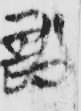訟
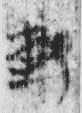○（範）
